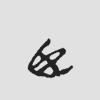臣
